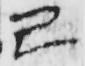己
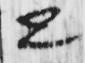巳
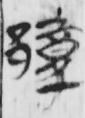复
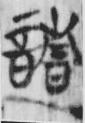請
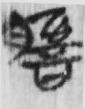䌛
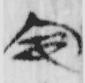{宀𠁩}
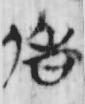俈
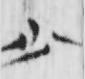少
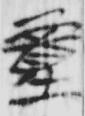童
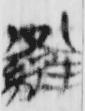羅
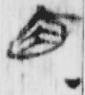角
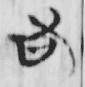右
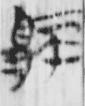馭（御）
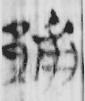郙
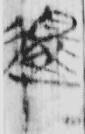還
